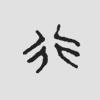行
